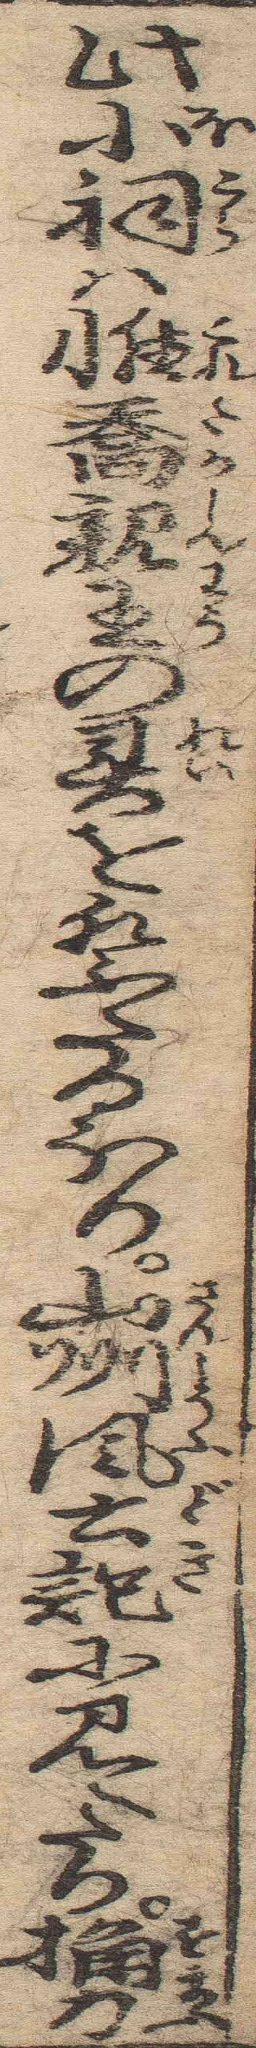此小祠は惟喬親王の霊を祭たるなり。山州風土記に見えたり。捔力
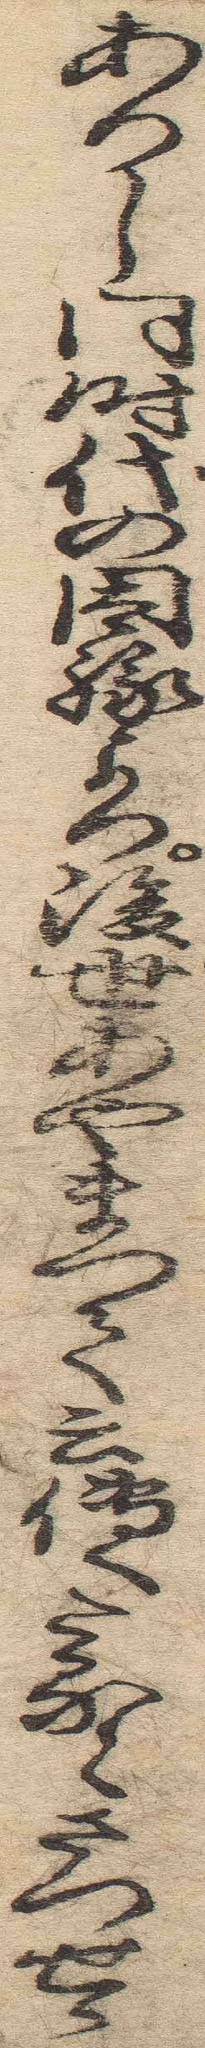ありし同時代の因縁より。後世あやまつて云伝えたるとさつせら
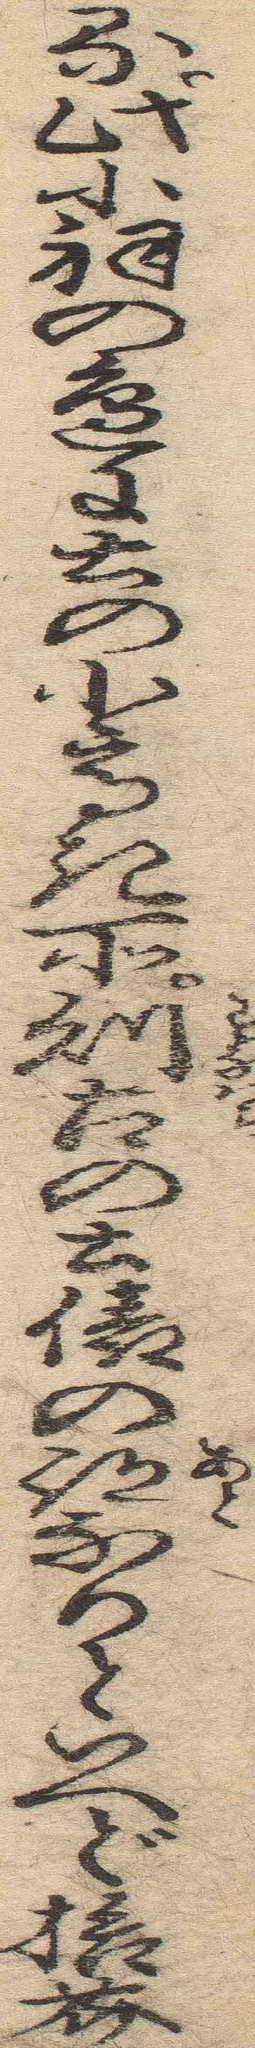る。此小祠の辺に土の小髙き所。則右の土俵の跡なりといへど拾芥
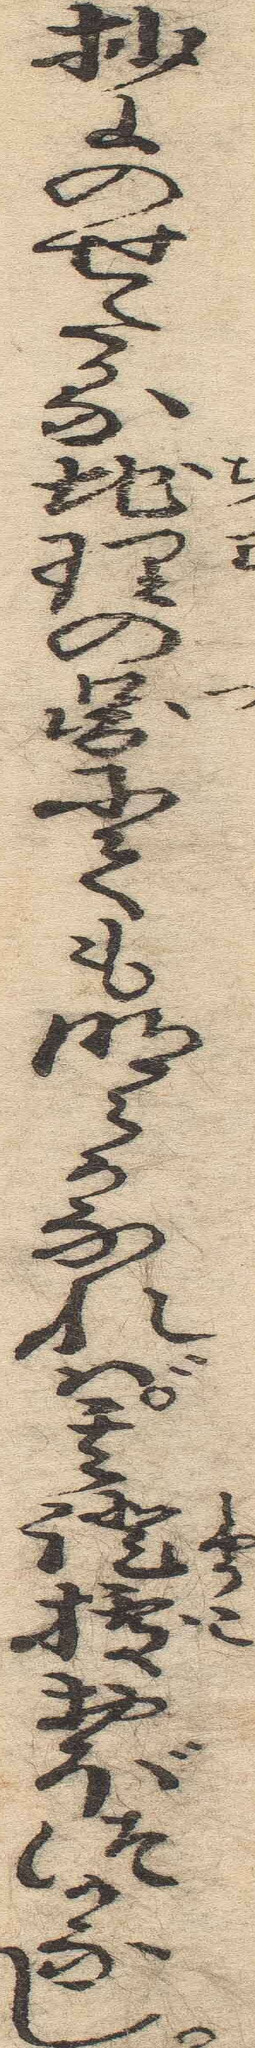抄にのせたる地理の圖にても明らかなば。其証拠おぼつかなし。
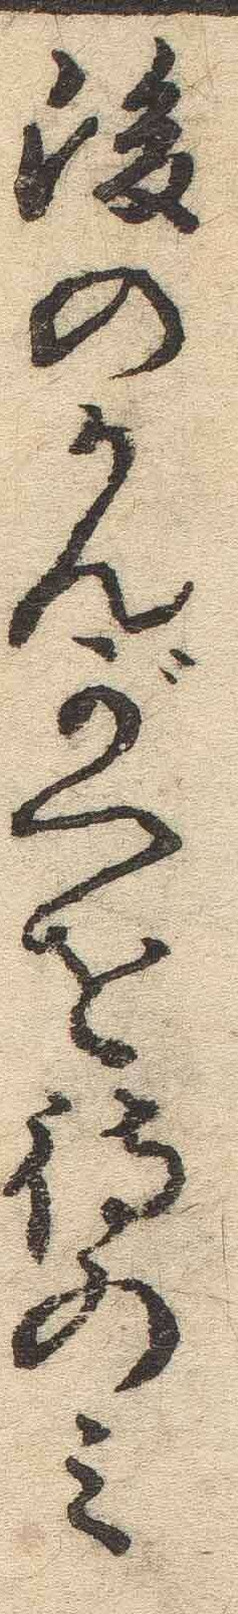後のかんがへを待のみ
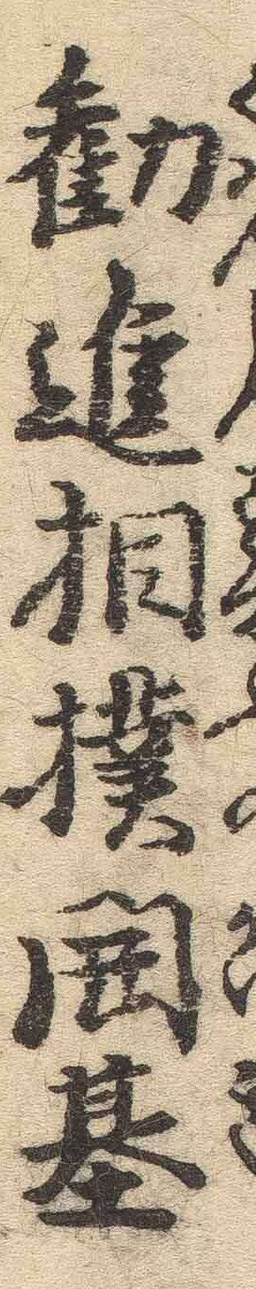勧進相撲開基
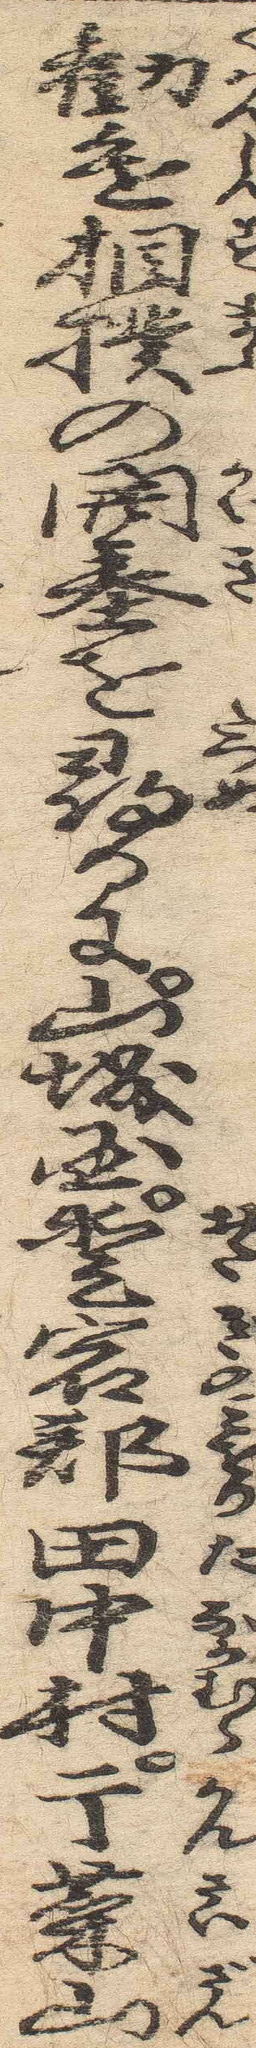勧進相撲の開基を尋るに。山城国。愛宕郡田中村。干菜山
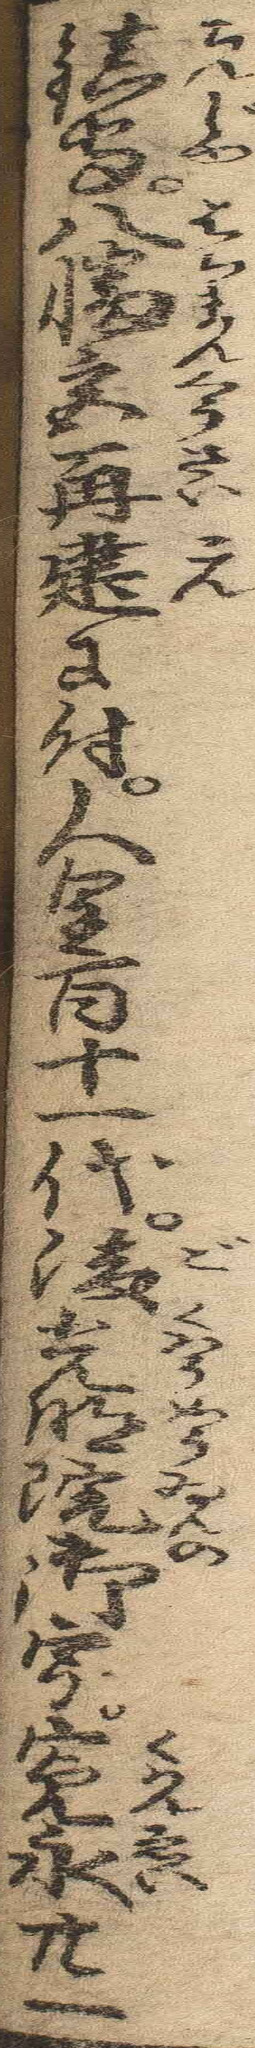鎮守。八幡宮再建に付。人皇百十一代。後光明院御宇。寛永廿一
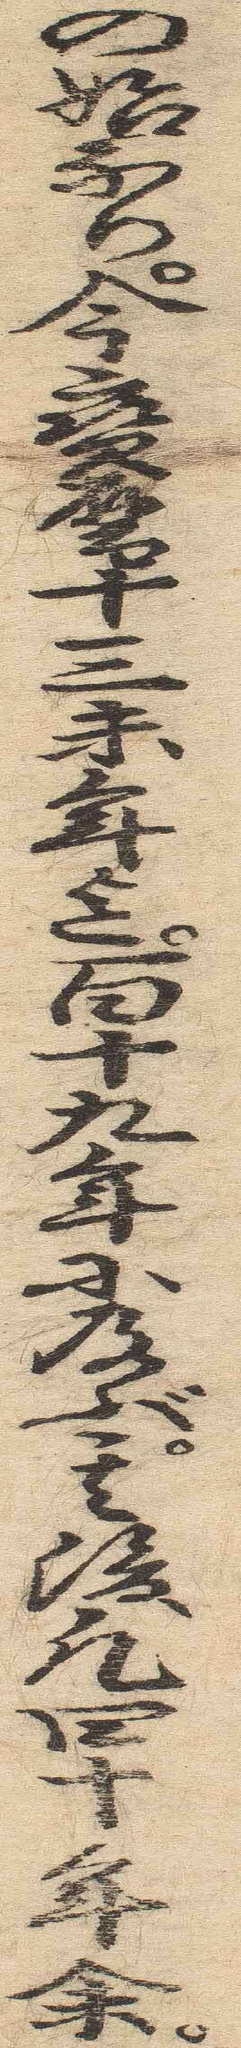の始なり。今宝暦十三未年迄。百十九年に及ぶ。其後凡四十年余。
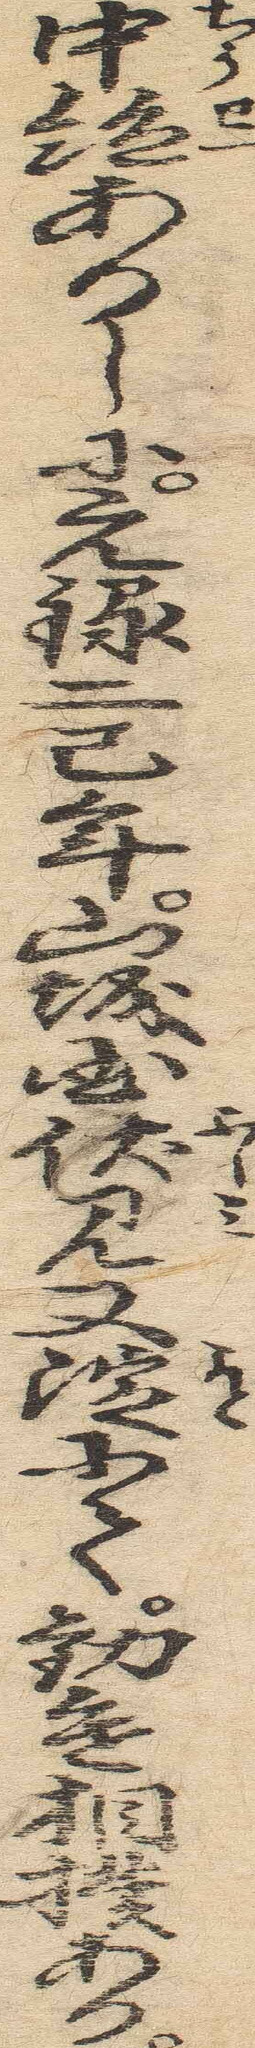中絶ありしに。元禄二己年。山城国伏見又淀にて。勧進相撲あり。
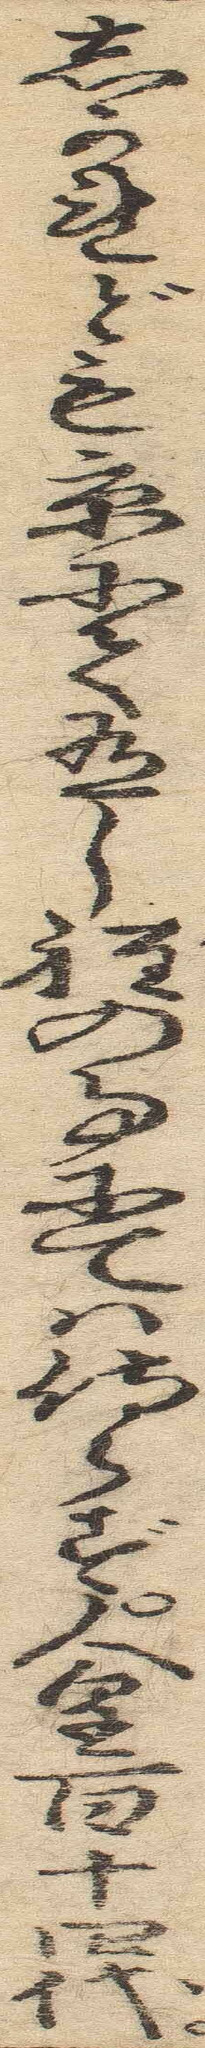しかれども京にて有し程の事にては侍らず。人皇百十四代。
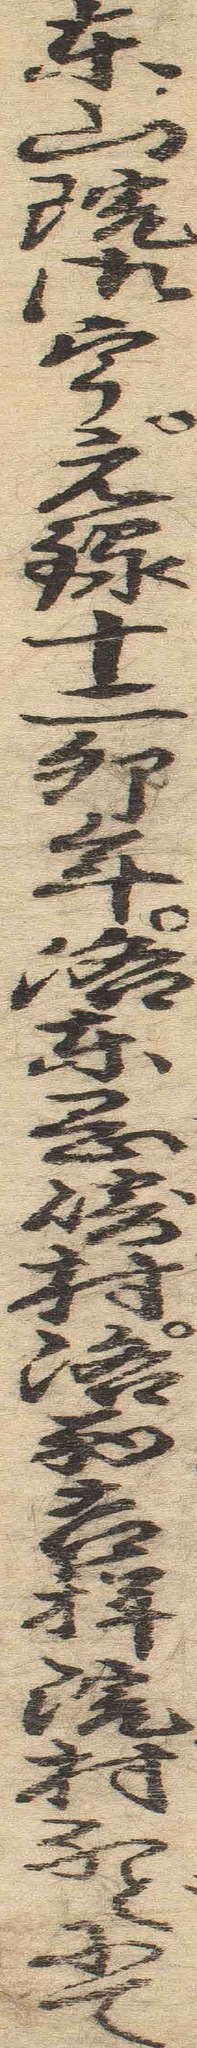東山院御宇。元禄十二卯年。洛東岡崎村。洛西吉祥院村などにて
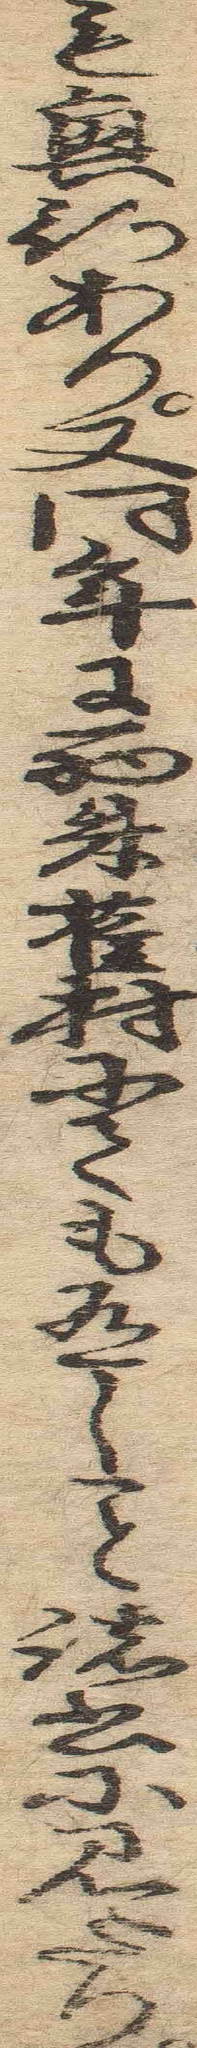も興行あり。又同年に西朱雀村にても有しこと諸書に見えたり。
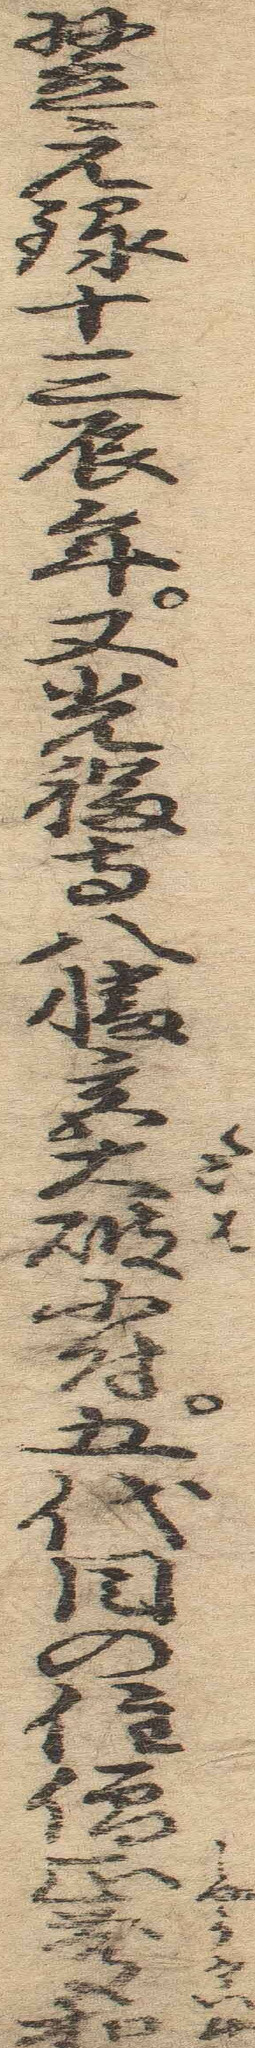翌元禄十三辰年。又光福寺八幡宮大破に付。五代目の住僧正慶和
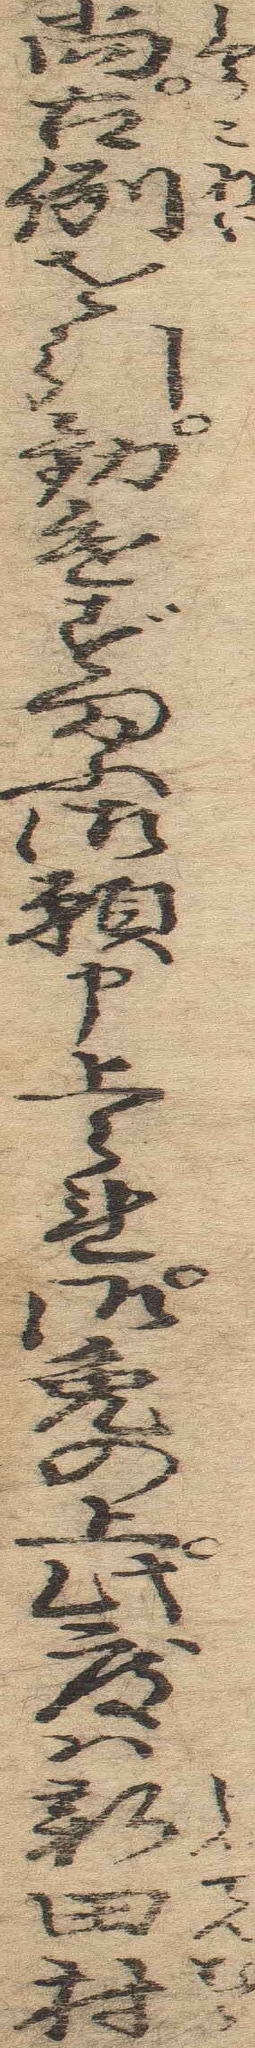尚。古例を引。勧進ずまふ御願申上られ。御免の上。此度は新田村

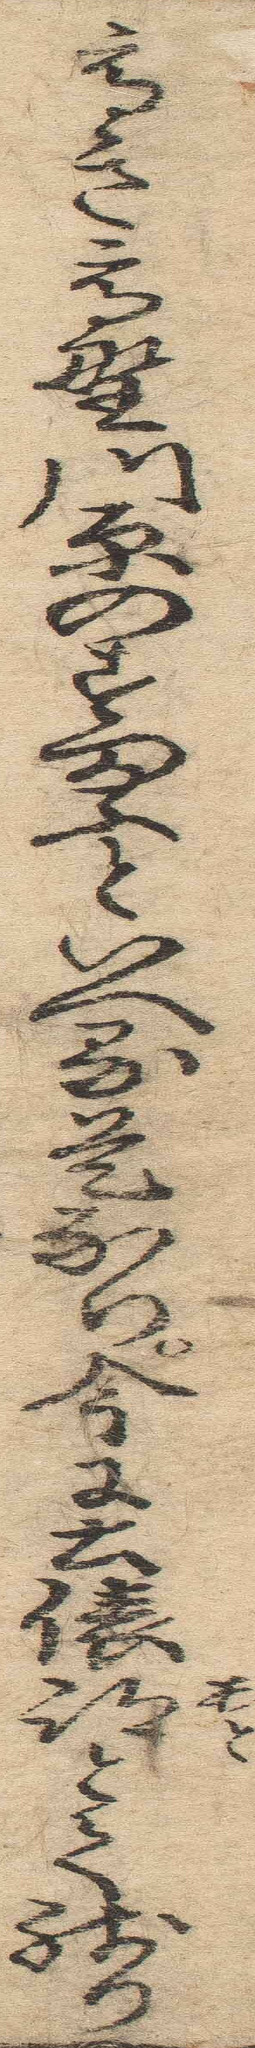髙き髙野川原のすまふといへる是なり今に土俵跡とて残り
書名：古今相撲大全
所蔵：東京学芸大学附属図書館 国文学研究資料館
